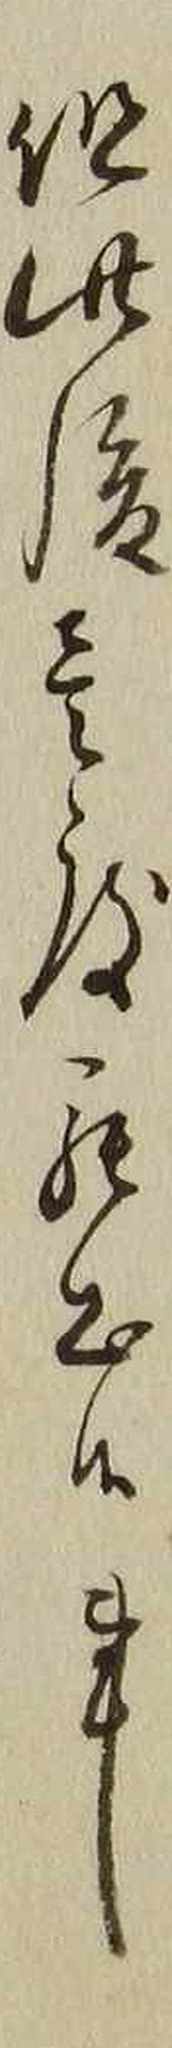但此後壱度罷出候事
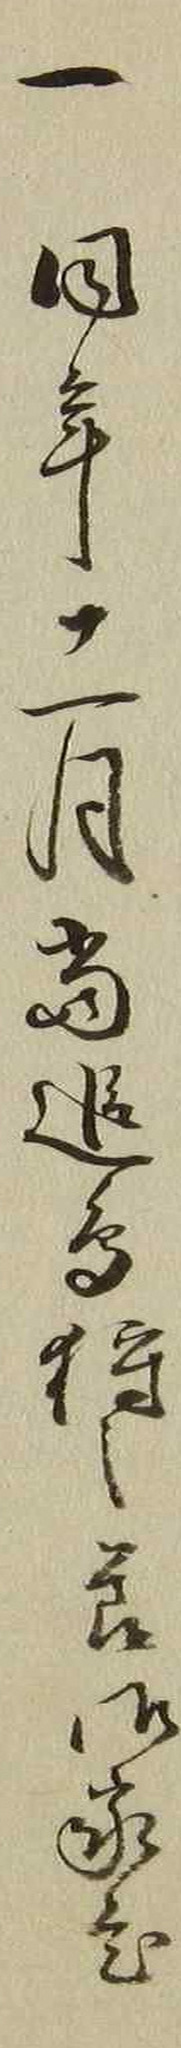一同年十一月当追鳥狩之節御家老
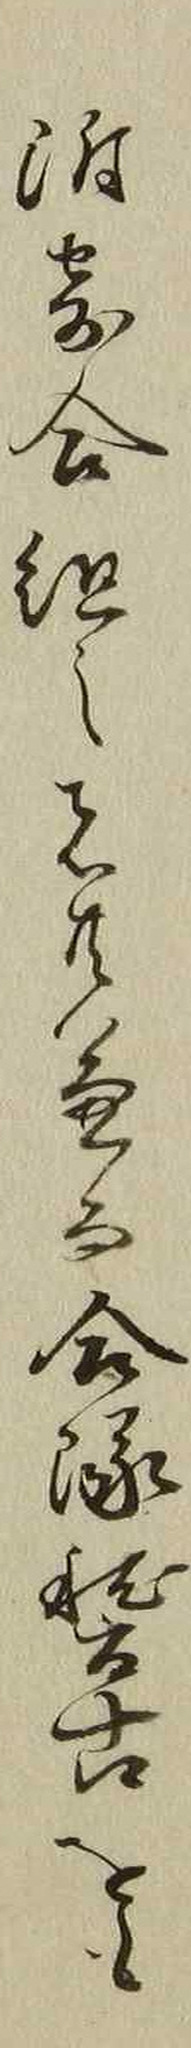附寄合組之者共兼而合隊稽古をも
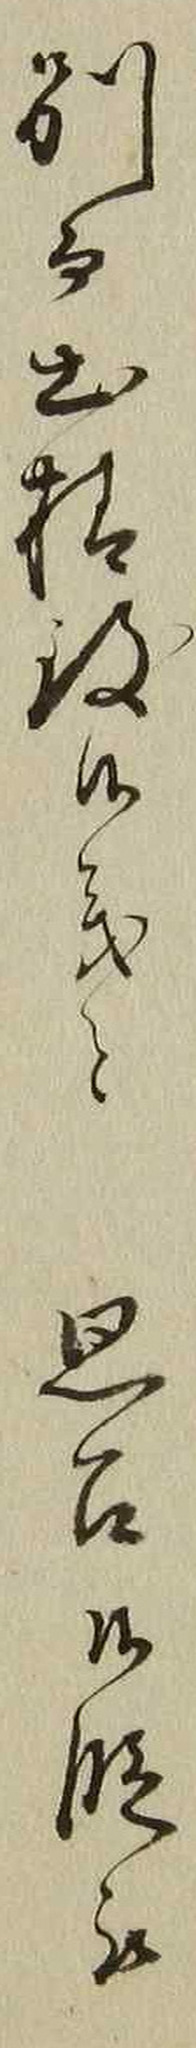別而出精致候義と思召候段被
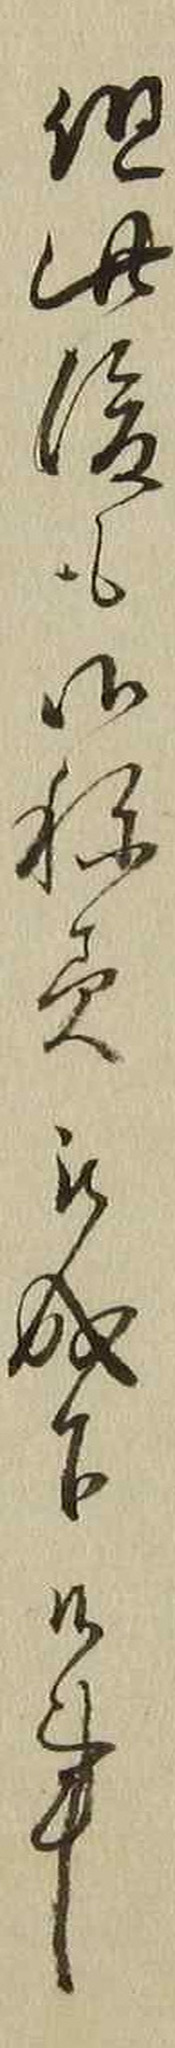但此後も御称美被成下候事
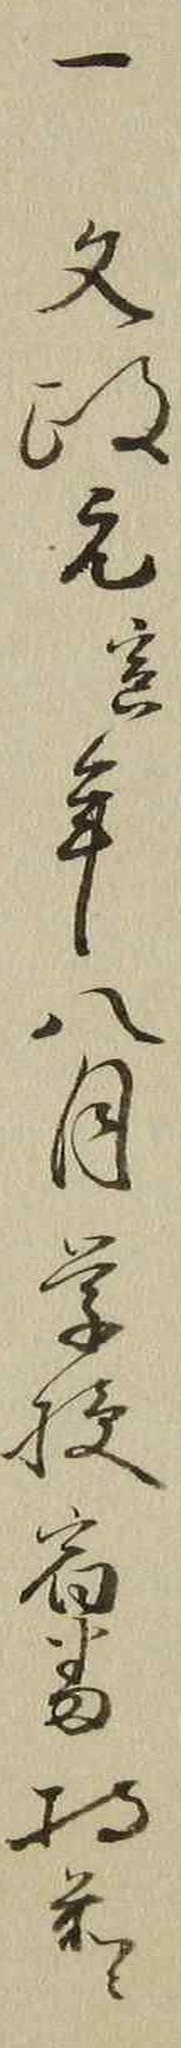一文政元寅年八月学授宿番持前ニ
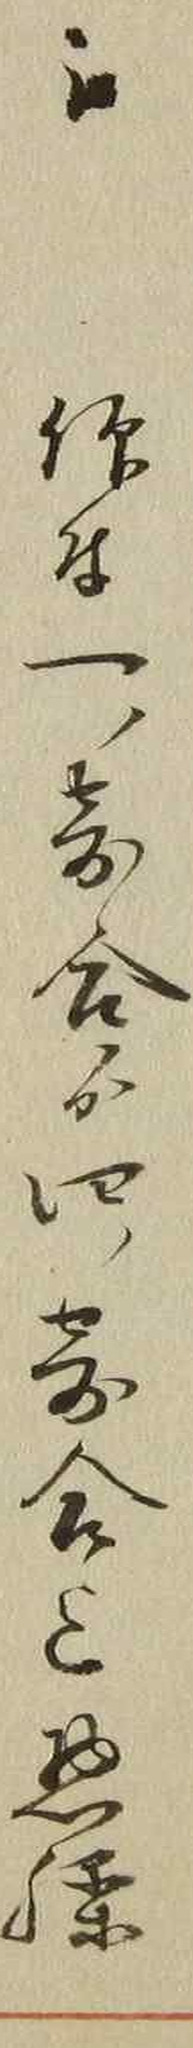被仰付一ノ寄合ゟ四ノ寄合迄惣繰
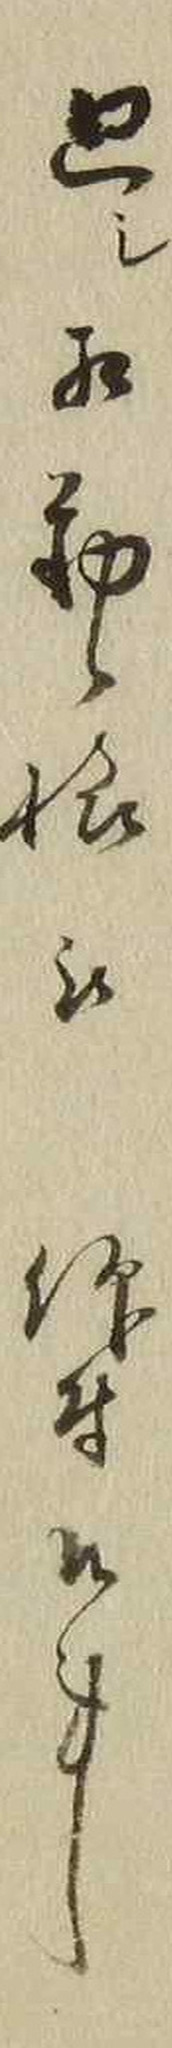廻シ相勤候様被仰付候事
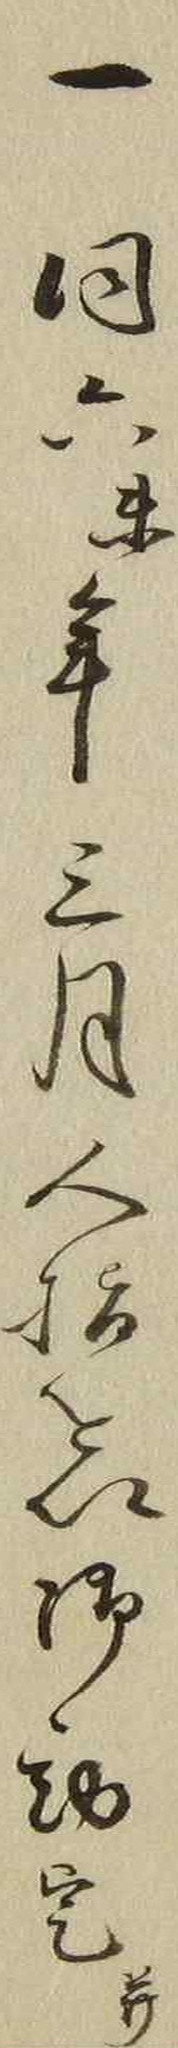一同六未年三月人指を以御勘定幷
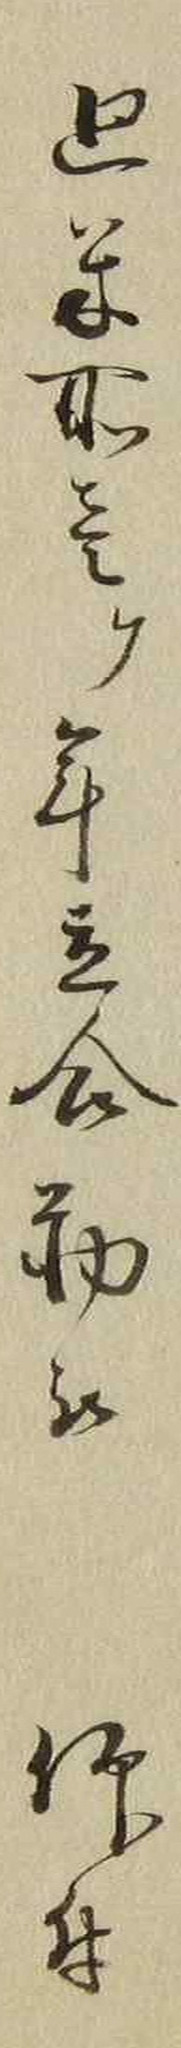廻米所壱ケ年立合勤被仰付
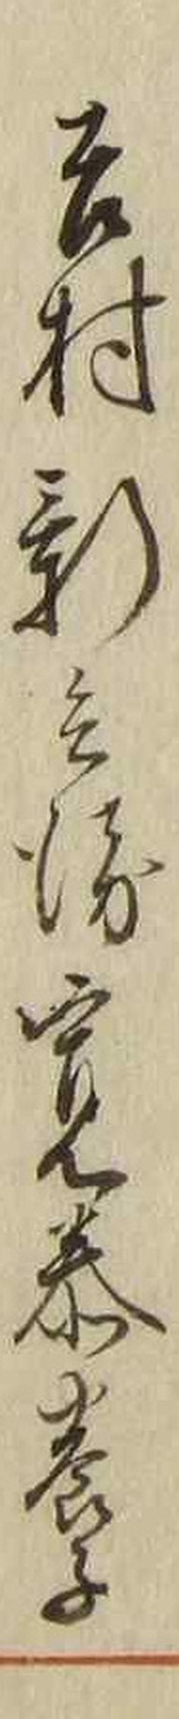吉村新兵衛寛泰養子

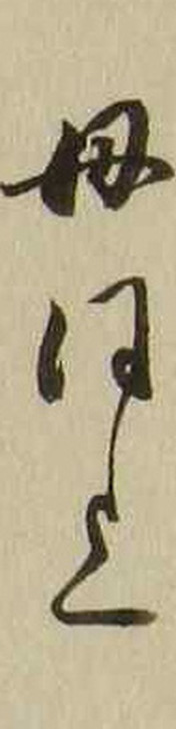母同上
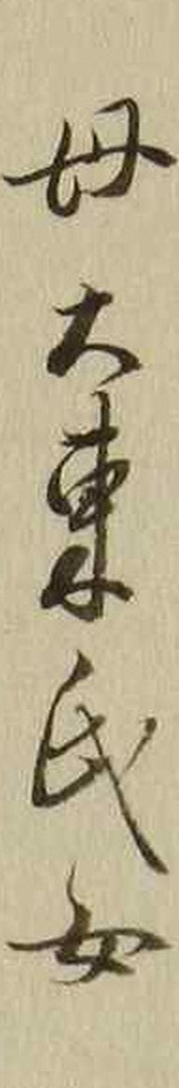母大東氏女
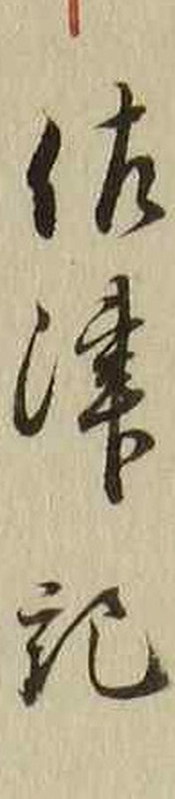佐津記
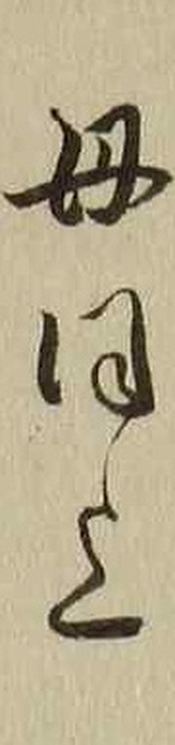母同上

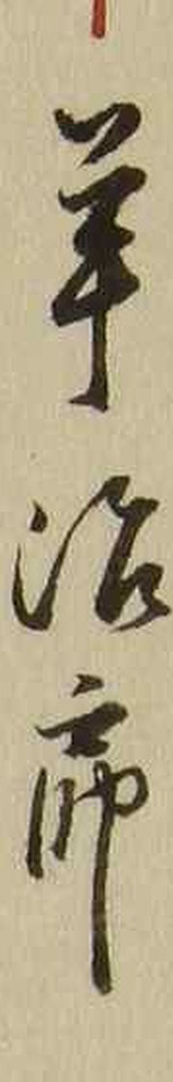羊治郎
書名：諸士系譜　巻之32　い之部32
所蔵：会津若松市立会津図書館
